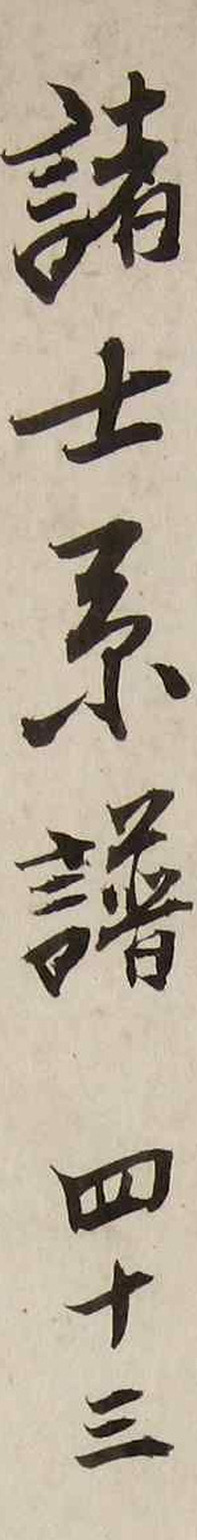諸士系譜四十三
